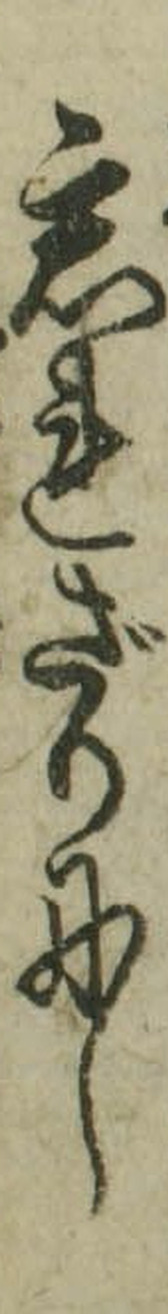忘れざりにし
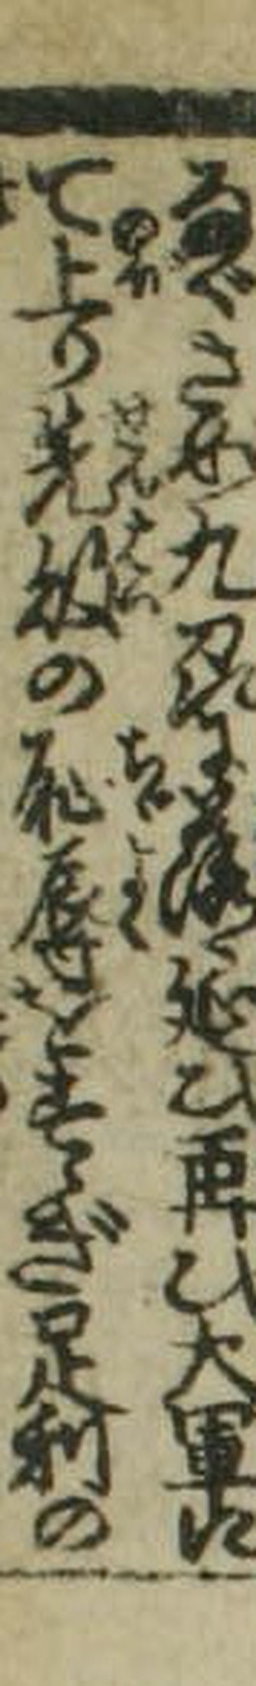て上り先敗の恥辱をすゝぎ足利の
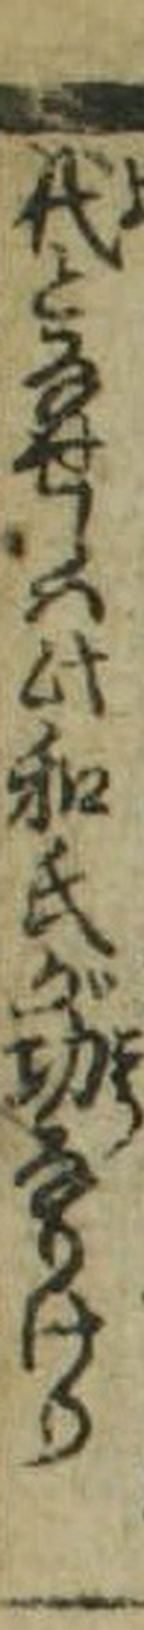代となせしは此和氏が功なりけり
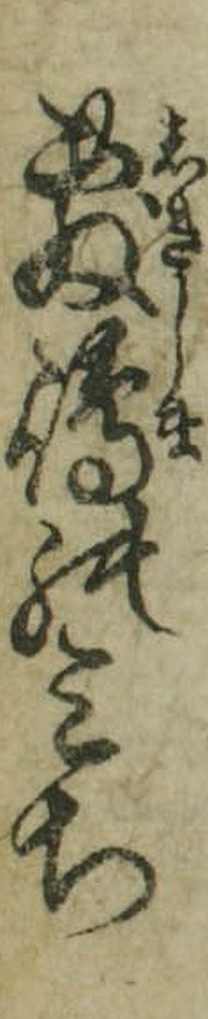敷嶋のみち

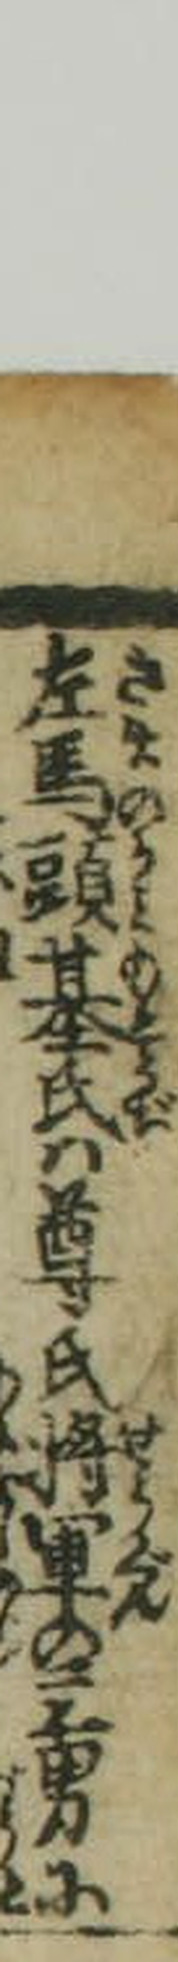左馬頭基氏は尊氏将軍の三男に
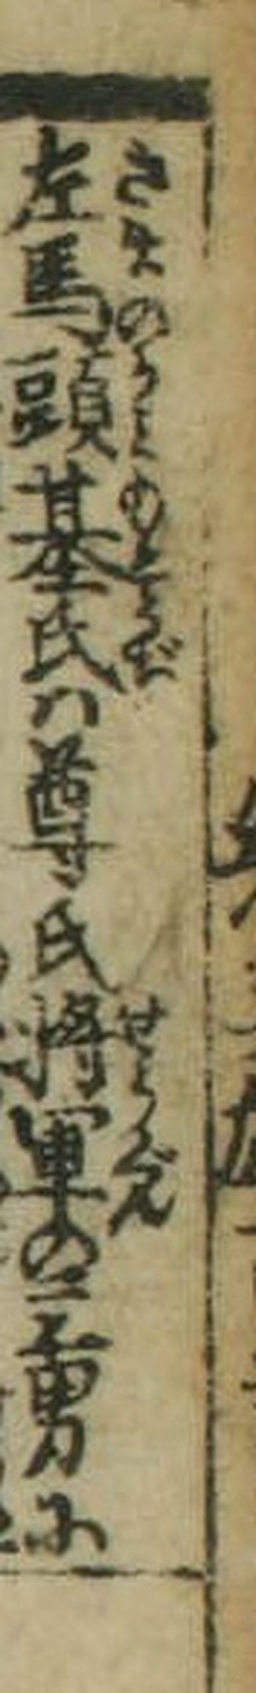左馬頭基氏は尊氏将軍の三男に
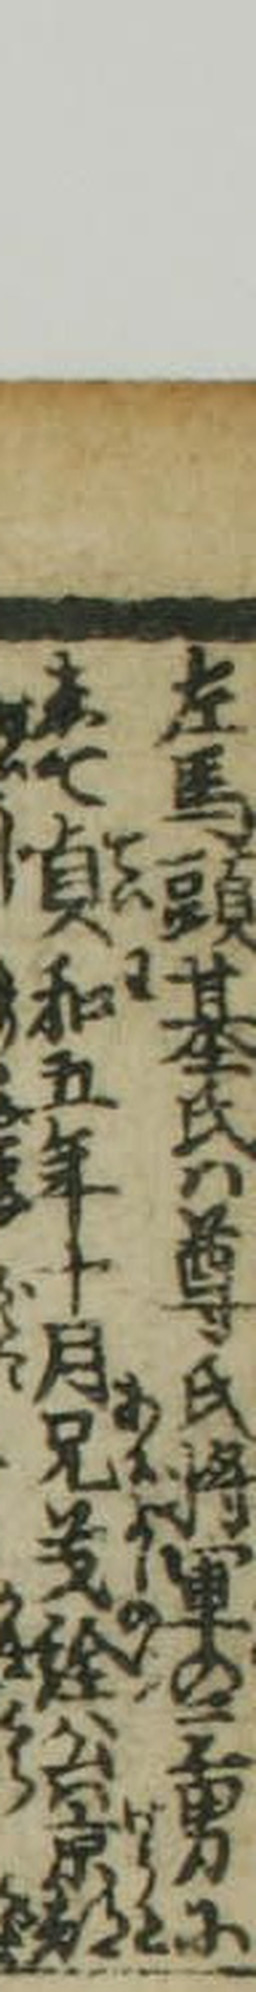して貞和五年十月兄義詮公は京都
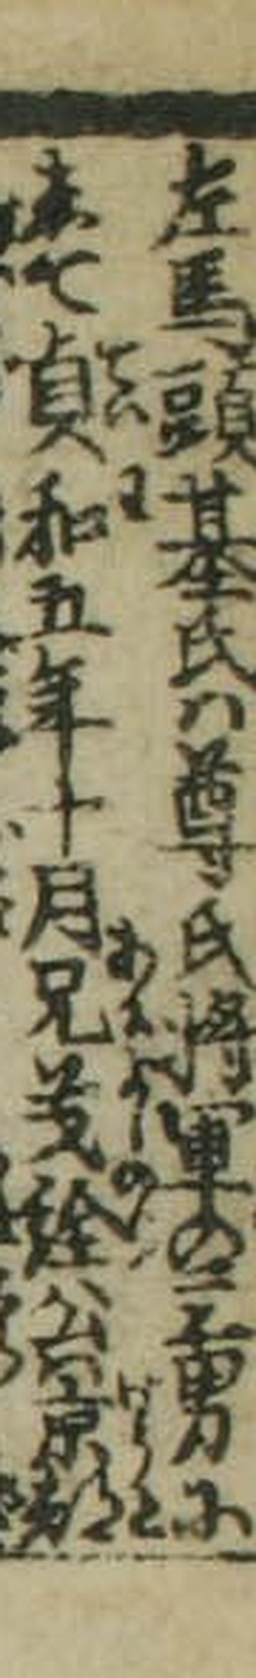して貞和五年十月兄義詮公は京都
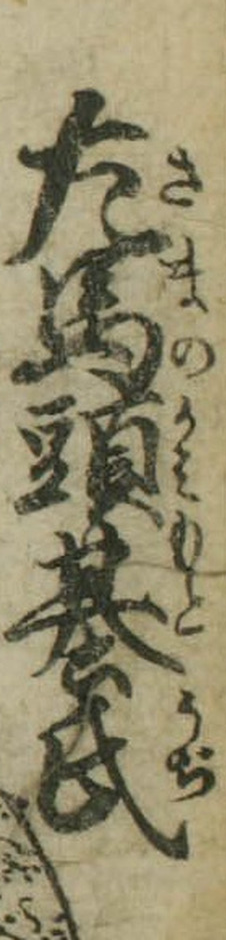左馬頭基氏
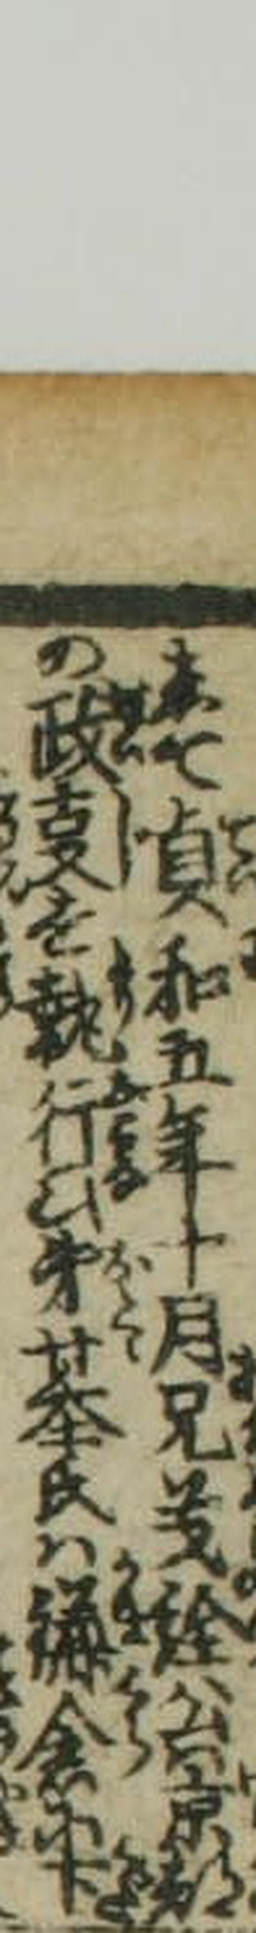の政事を執行ひ弟基氏は鎌倉に下
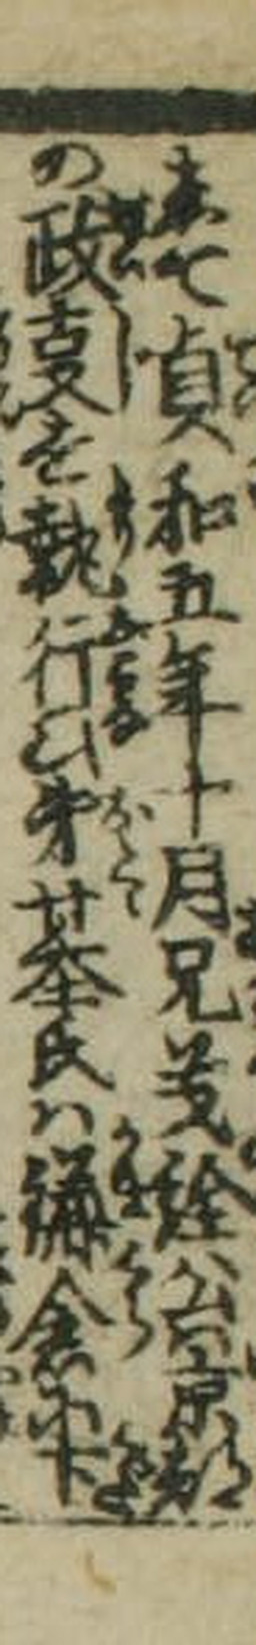の政事を執行ひ弟基氏は鎌倉に下
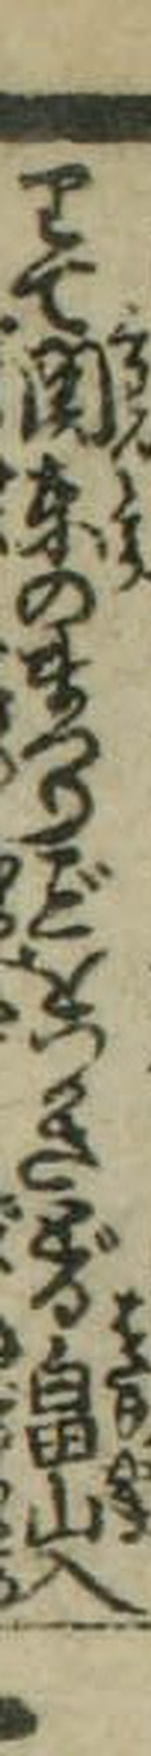りて関東のまつりごとをつかさどる畠山入
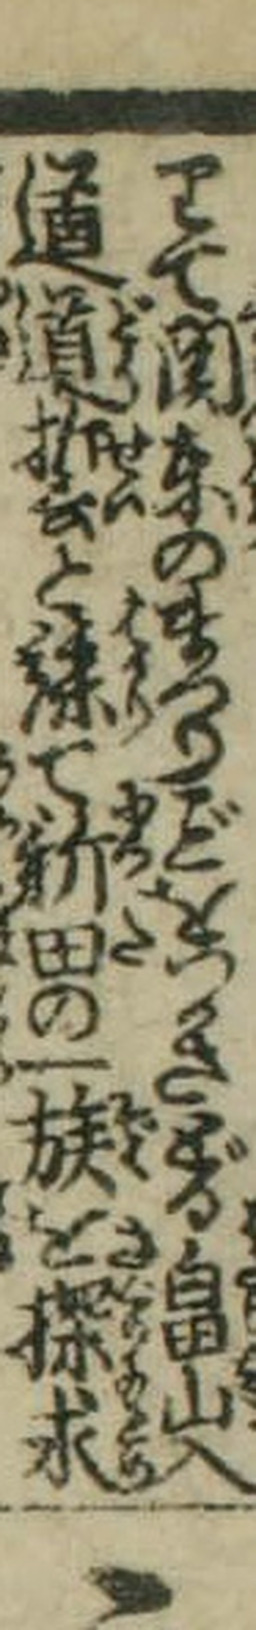道道誓と謀て新田の一族を探求
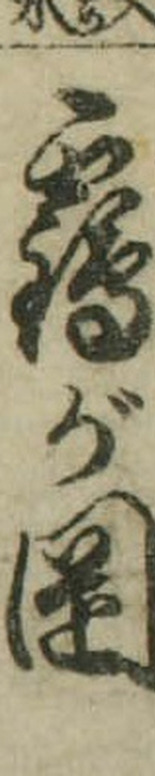靏が岡
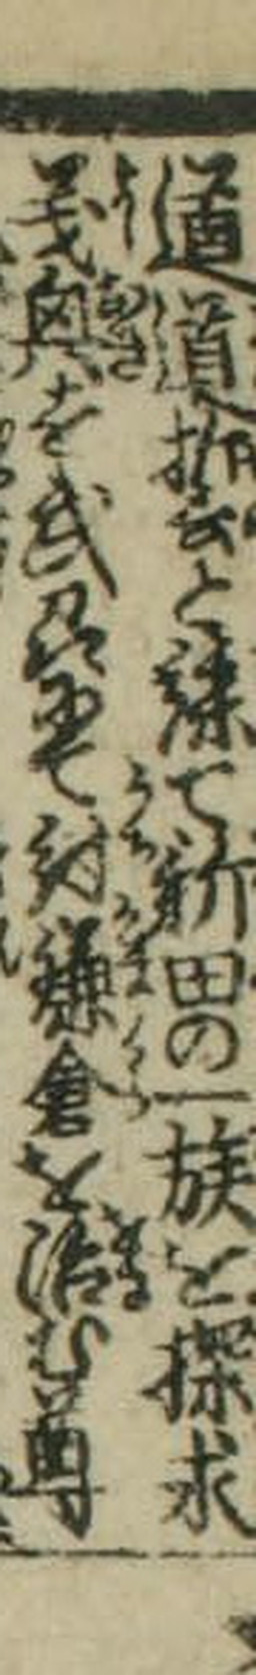義興を武州にて討鎌倉を治む尊
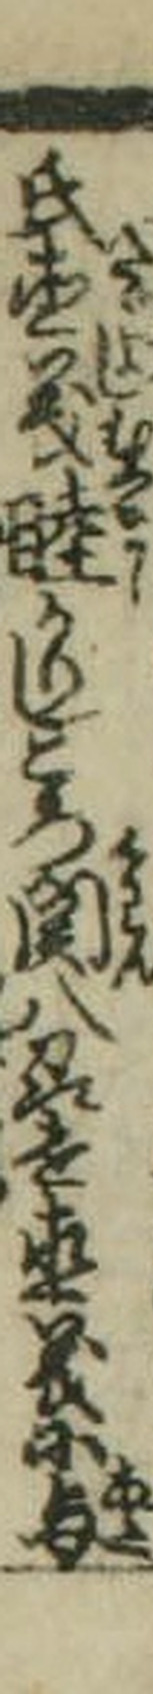氏直義睦かりしころ関八州を直義に与
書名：續英雄百人一首
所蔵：東京学芸大学附属図書館
